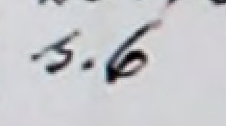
s. 6
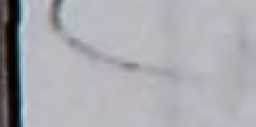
2
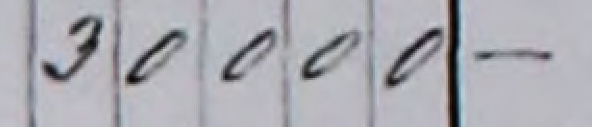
30000
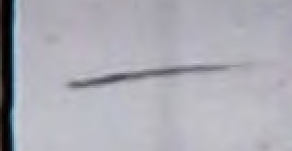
—
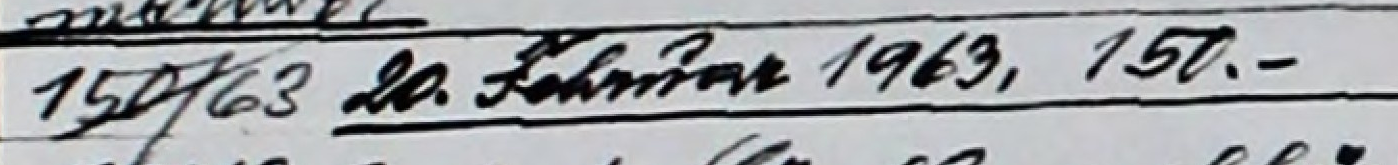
150/63 20. Februar 1963, 150.-
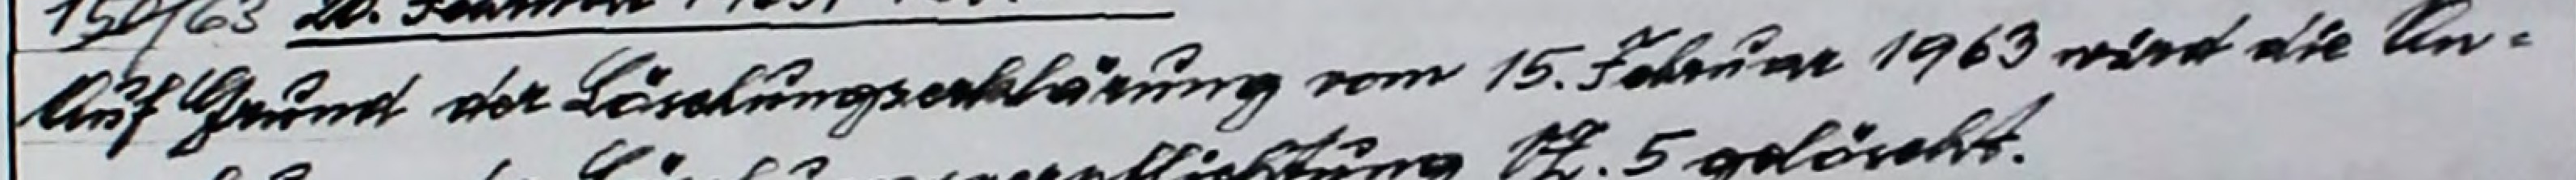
Auf Grund der Löschungserklärung vom 15. Februar 1963 wird die An=
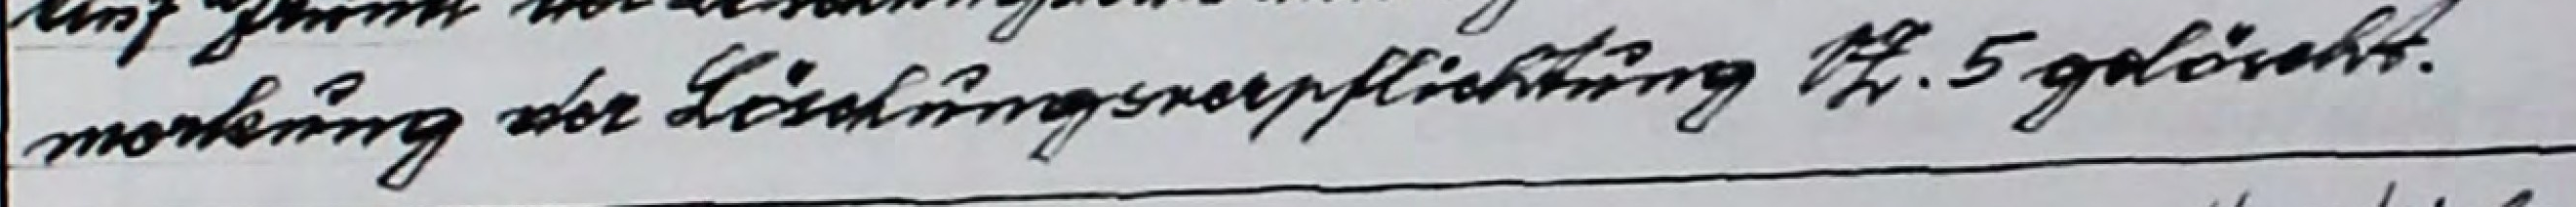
merkung der Löschungsverpflichtung OZ. 5 gelöscht.
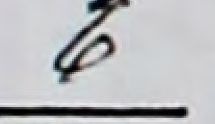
6
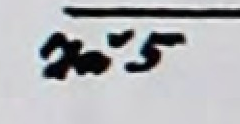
Zu 5
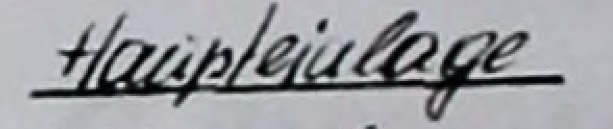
Haupteinlage
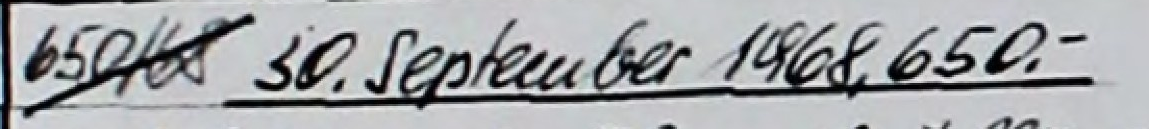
650/68 30. September 1968, 650.-
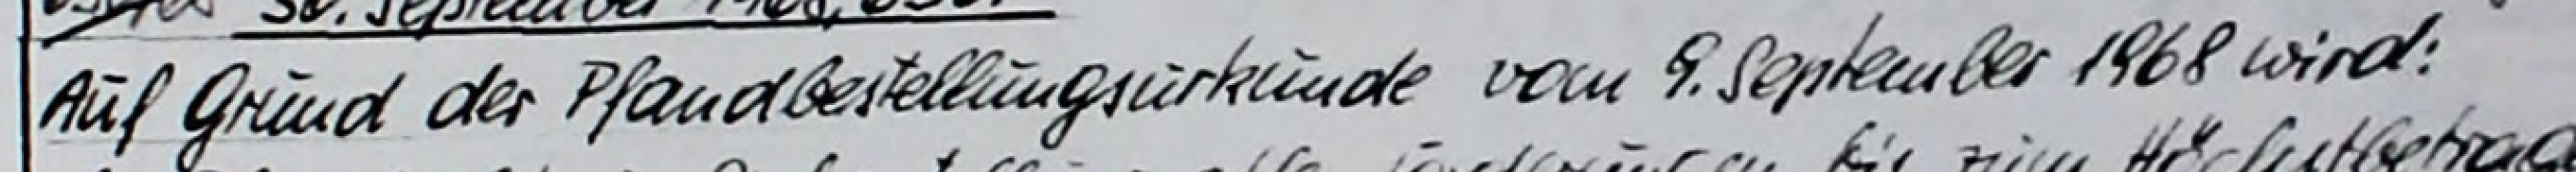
Auf Grund der Pfandbestellungsurkunde vom 9. September 1968 wird:
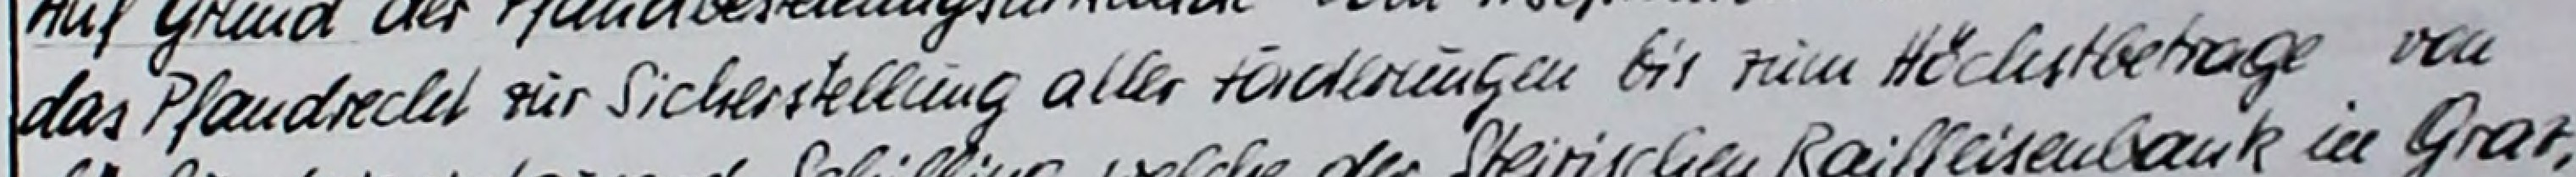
das Pfandrecht zur Sicherstellung aller Forderungen bis zum Höchstbetrage von
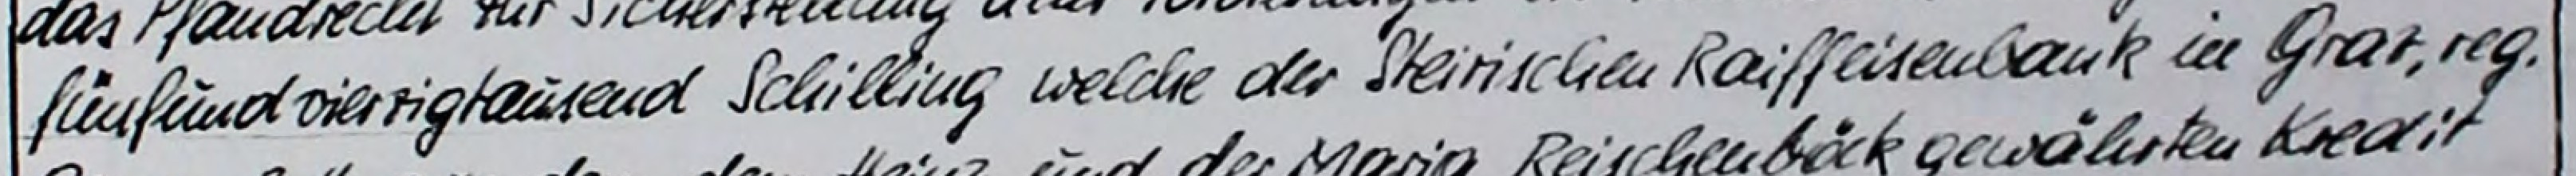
fünfundvierzigtausend Schilling welche der Steirischen Raiffeisenbank in Graz, reg.
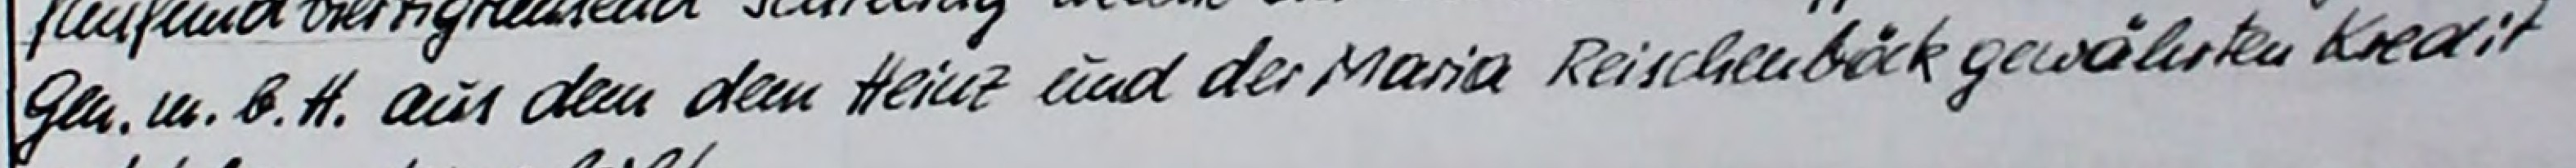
Gen. m. C. H. aus dem dem Heinz und der Maria Reischenböck gewährten Kredit
